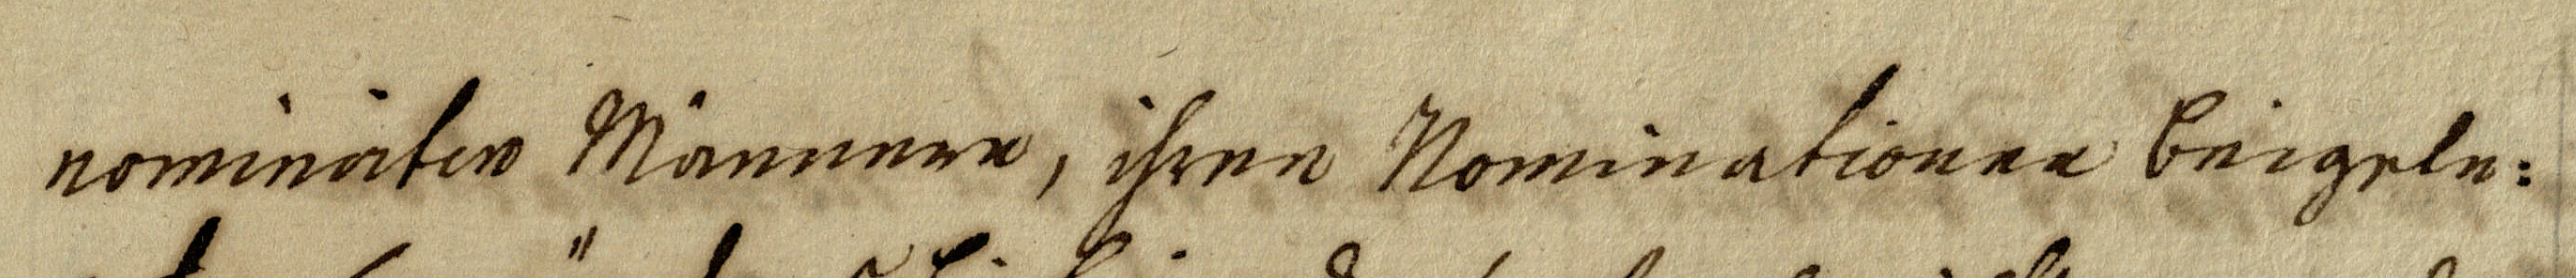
nominirten Männern, ihren Nominationen beigele¬
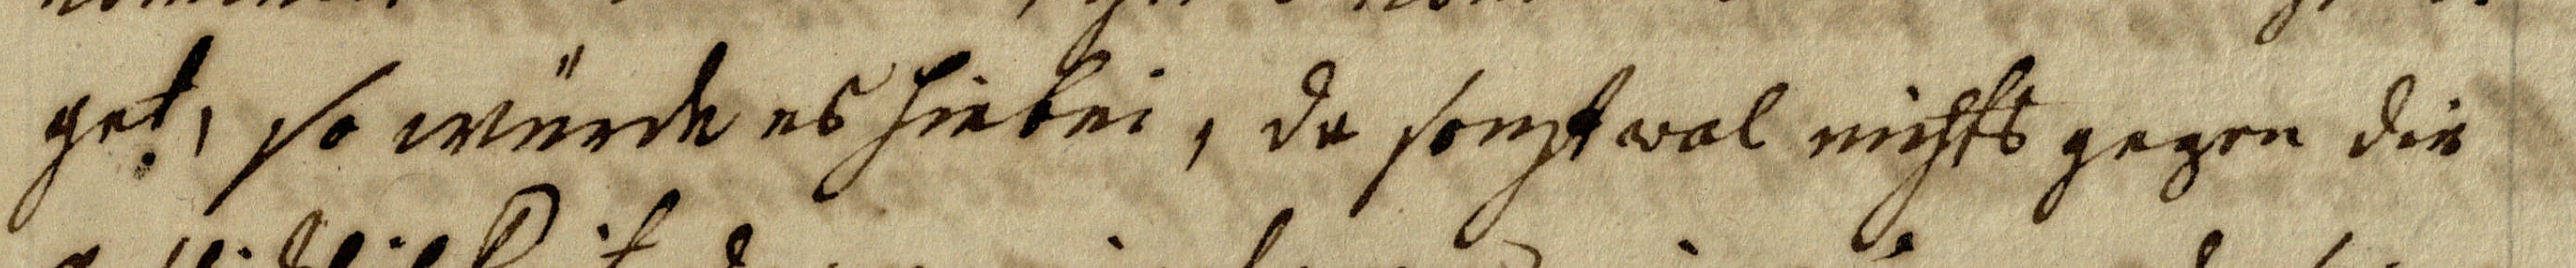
get, so würde es hiebei, da sonst wol nichts gegen die
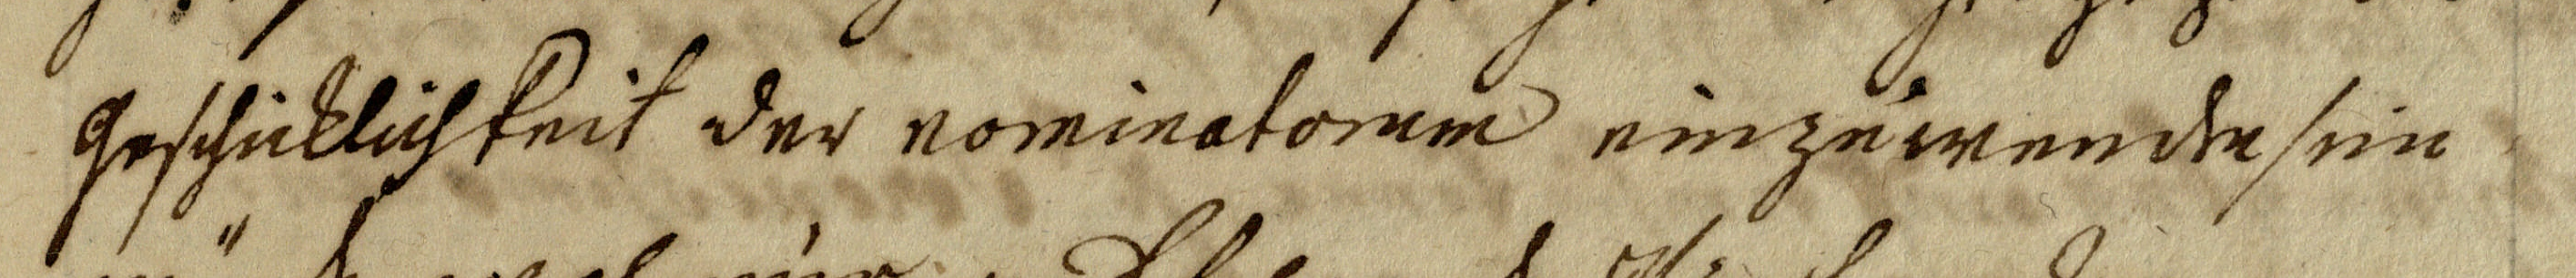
Geschicklichkeit der nominatorum einzuwenden sein
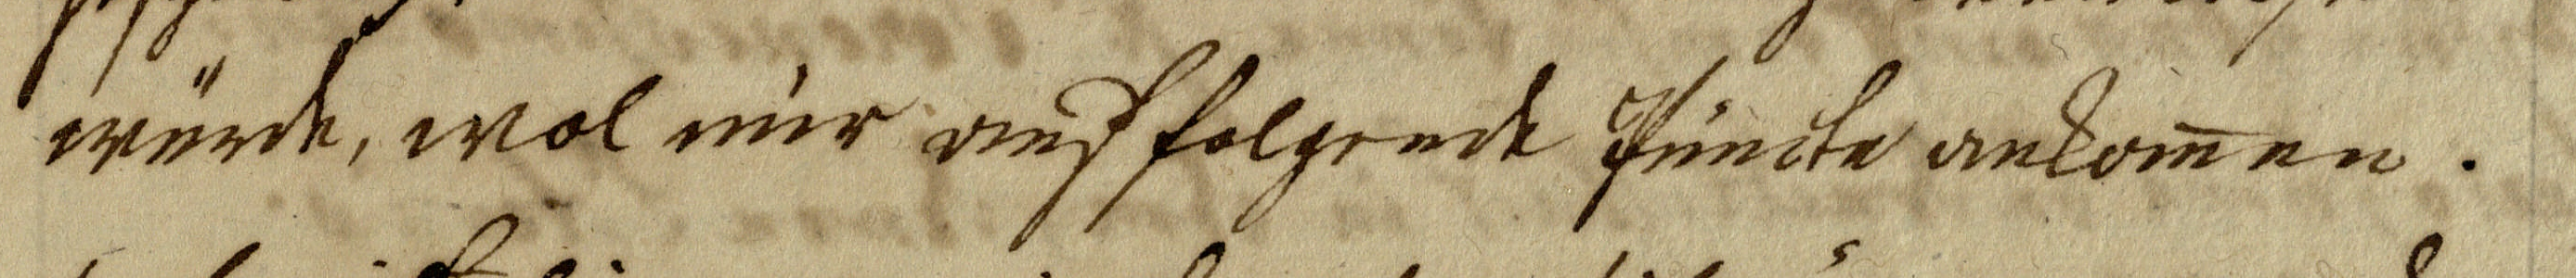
würde, wol nur auf folgende Puncte ankomen.
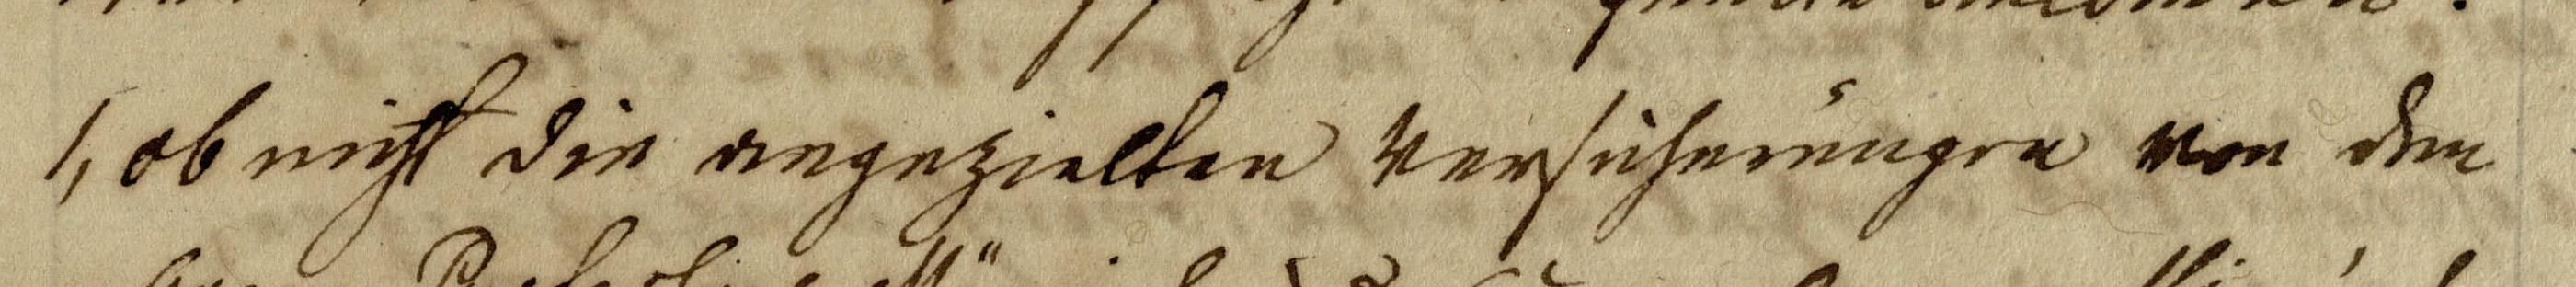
t1, ob nicht die angezielten Versicherungen von dem
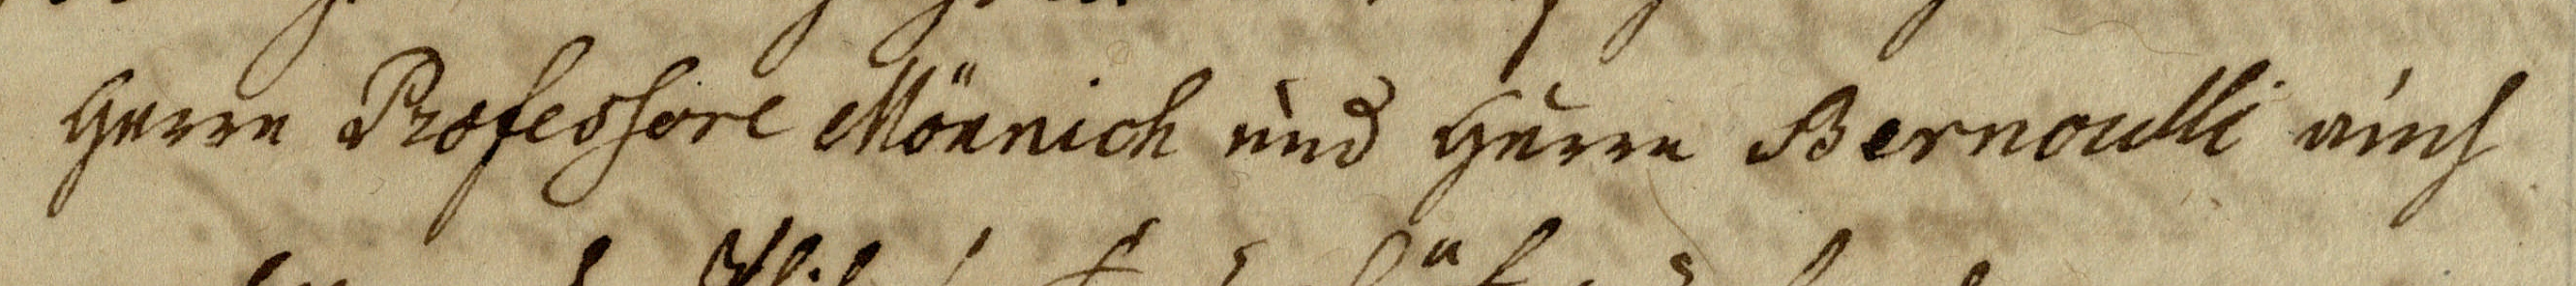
Herrn Professore Mönnich und Herrn Benoulli auch
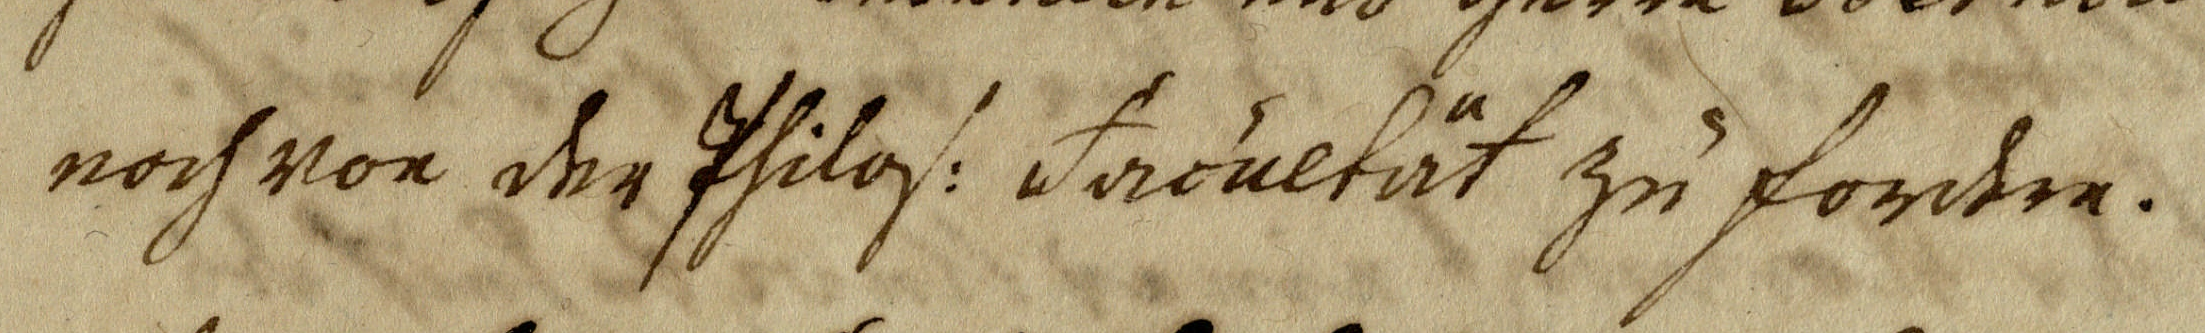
noch von der Philos. Facultät zu fordern.
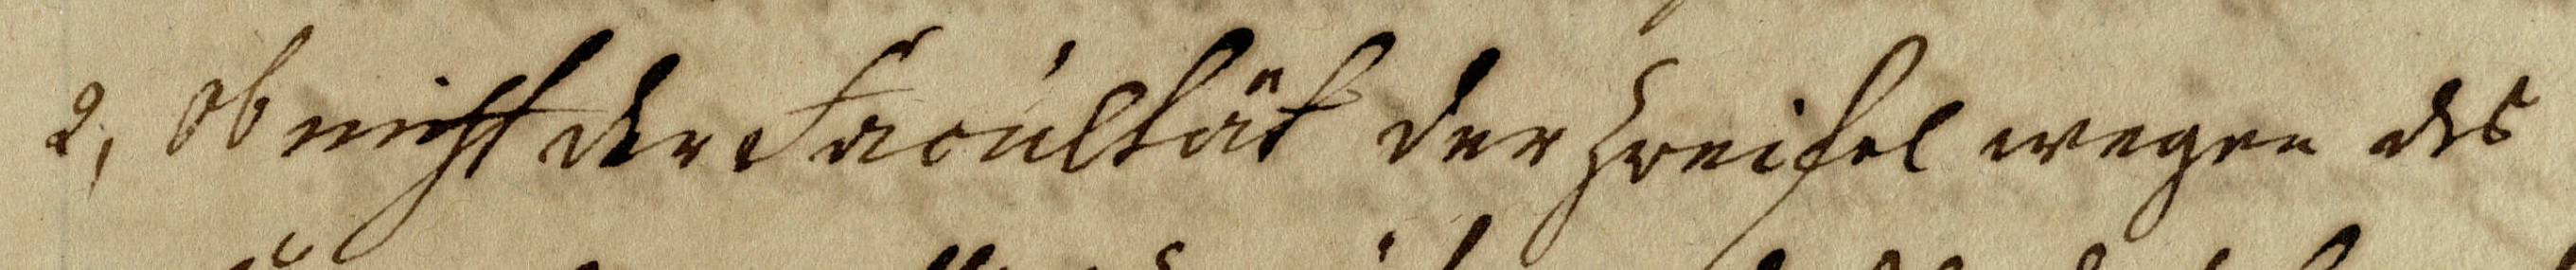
2, ob nicht der Facultät der Zweifel wegen des
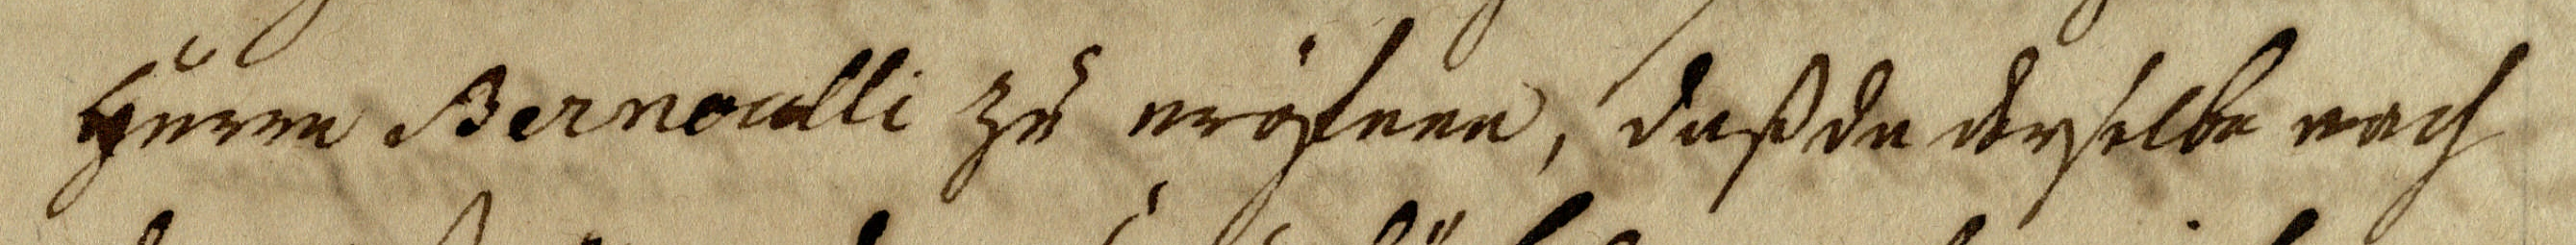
Herrn Bernoulli zu eröfnen, daß da derselbe nach
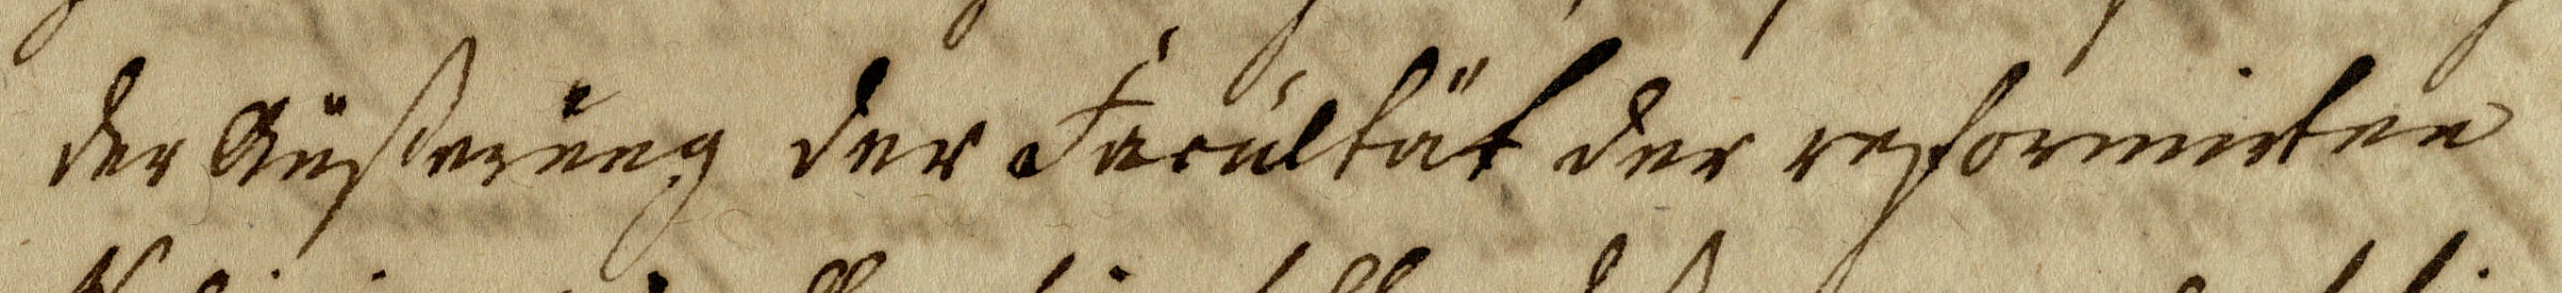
der Äußerung der Facultät der reformirten
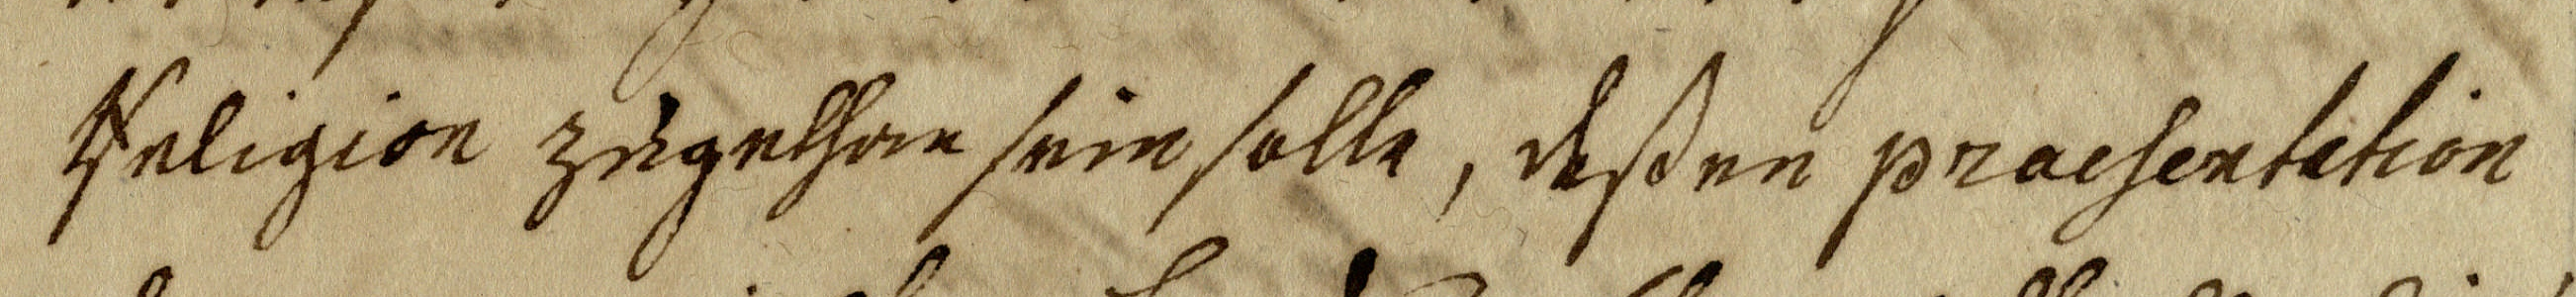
Religion zugethan sein solle, deßen praesentation
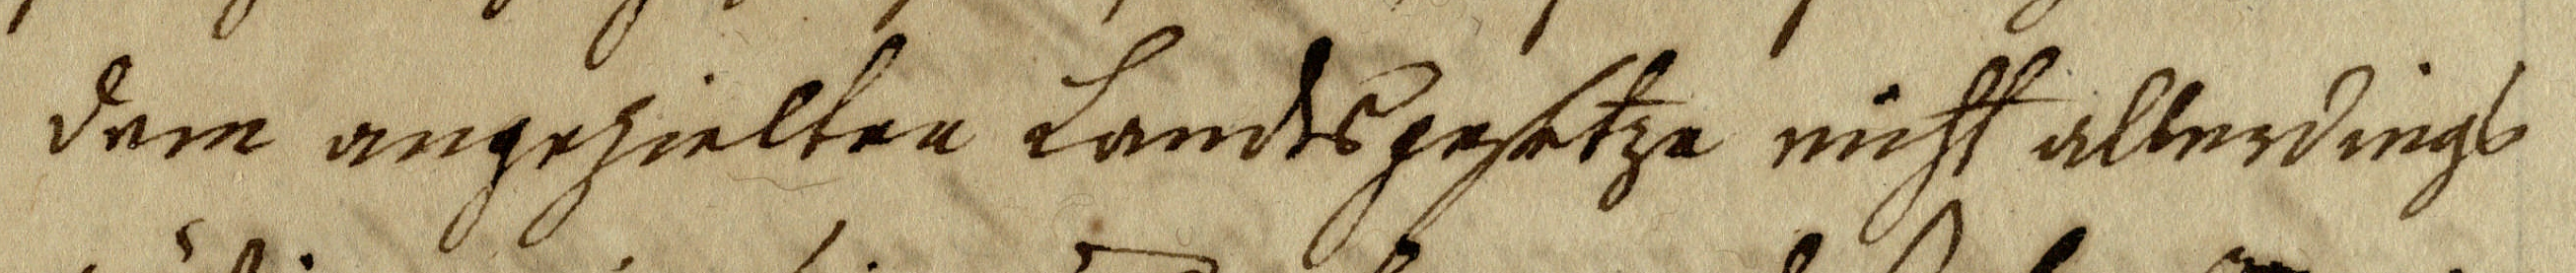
dem angezielten Landesgesetze nicht allerdings
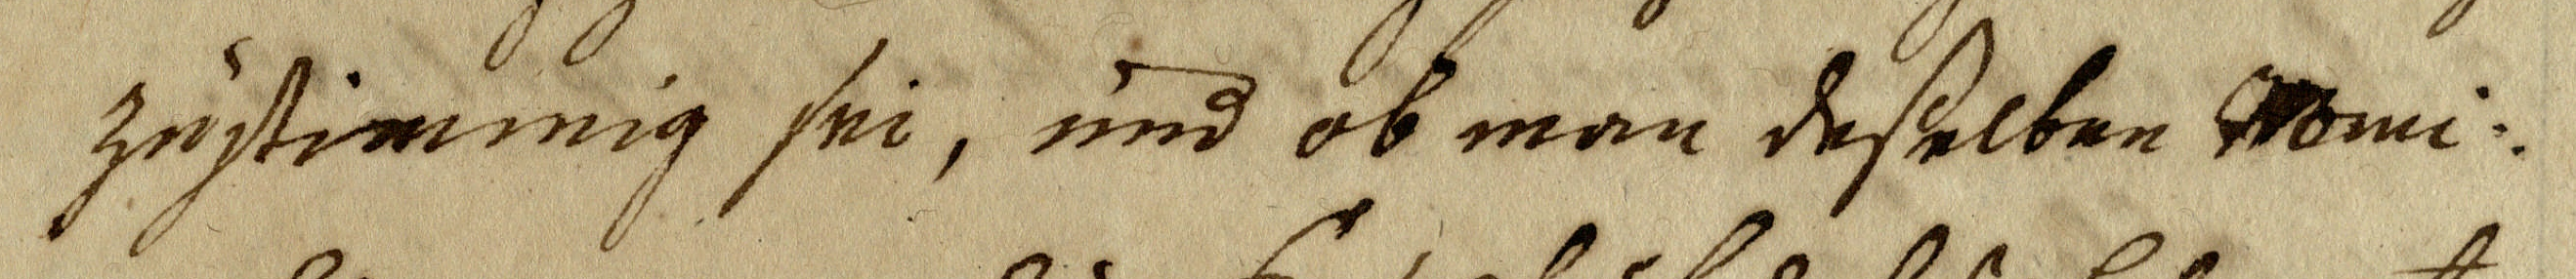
zustimmig sei, und ob man deßelben Nomi¬
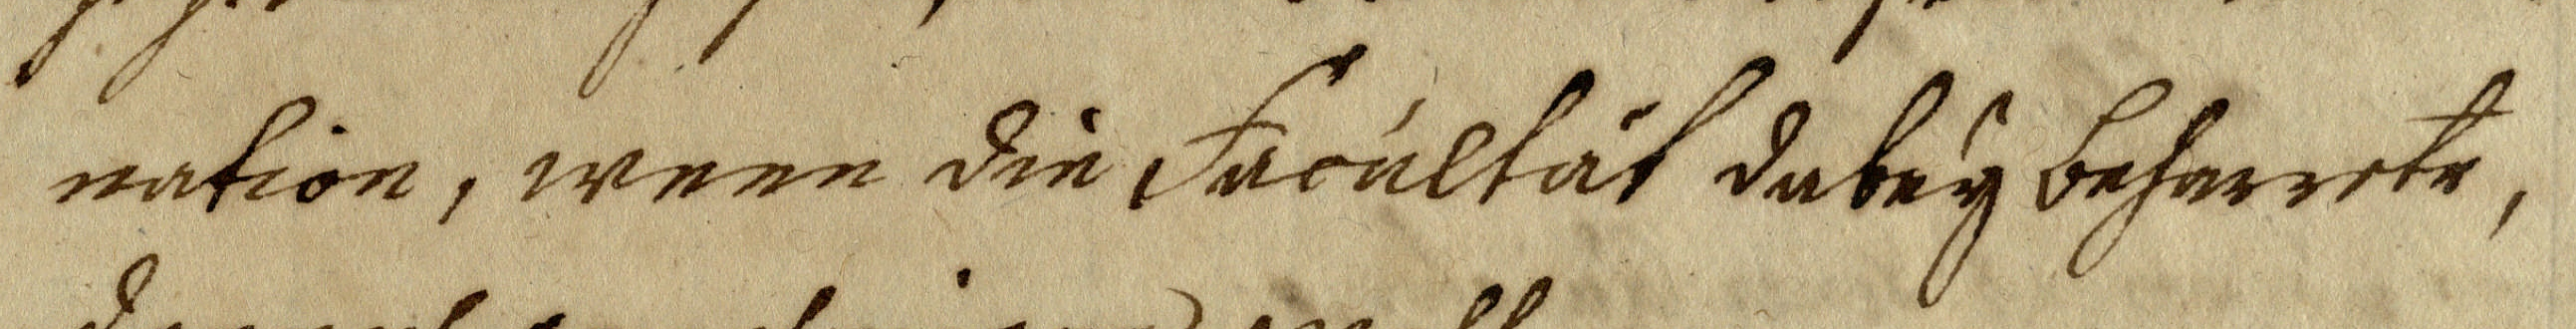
nation, wenn die Facultät dabeÿ beharrete,
